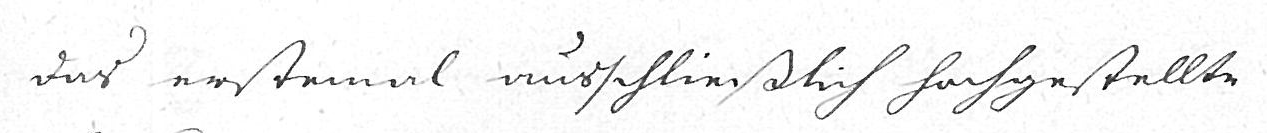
das erstemal ausschließlich hochgestellte
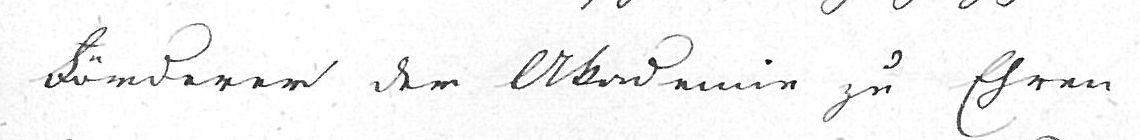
Förderer der Akademie zu Ehren-
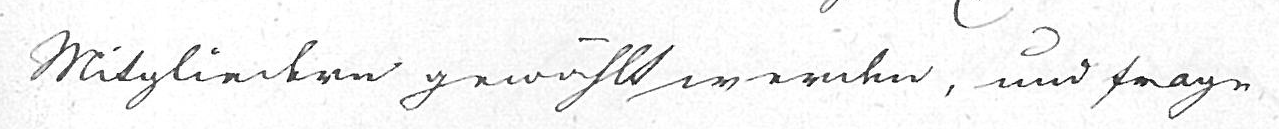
Mitgliedern gewählt werden, und frage
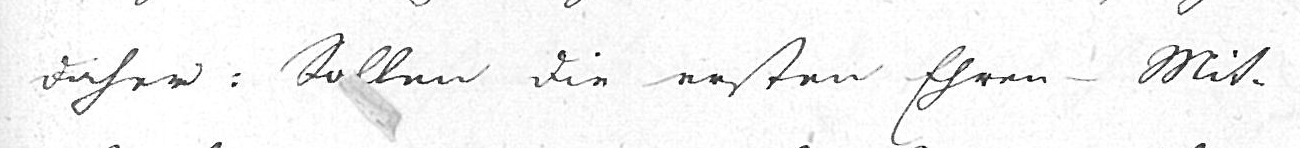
daher: Sollen die ersten Ehren-Mit-
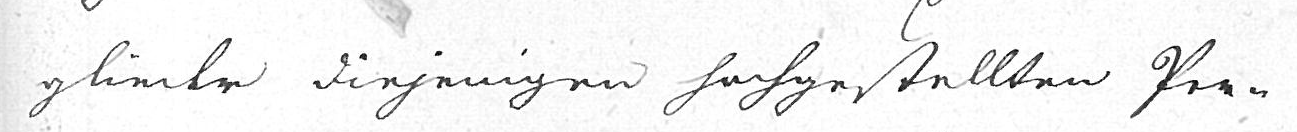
glieder diejenigen hochgestellten Per-
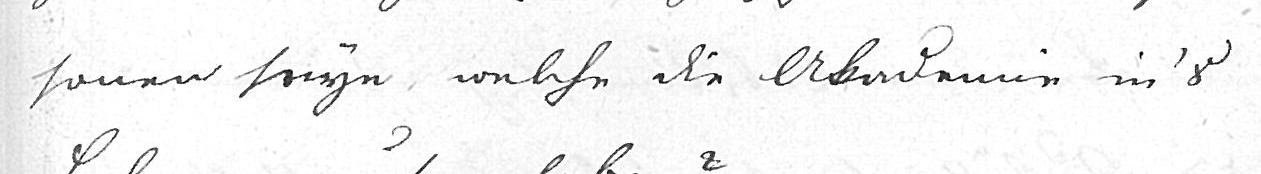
sonen seyn, welche die Akademie in's
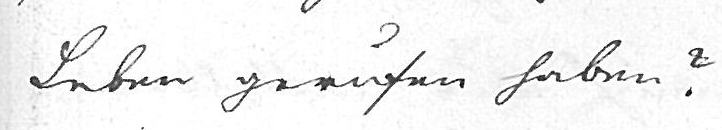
Leben gerufen haben?
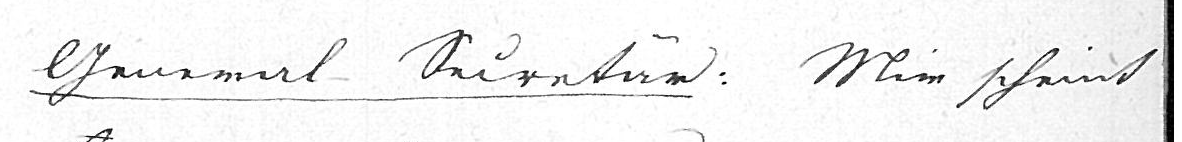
General-Secretär: Mit scheint
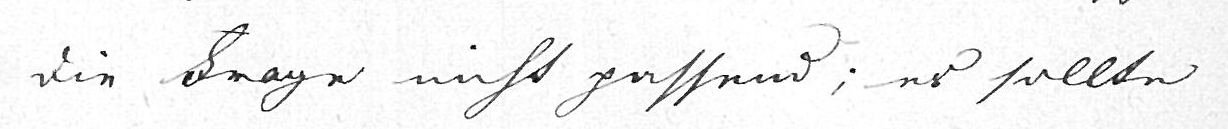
die Frage nicht passend; es sollte
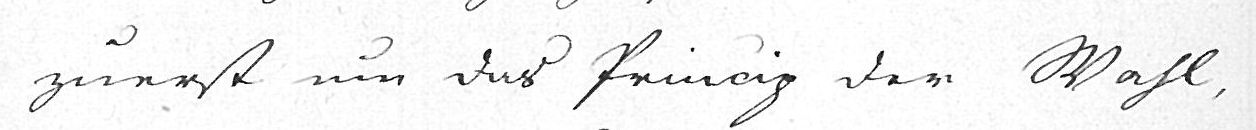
zuerste um das Princip der Wahl,
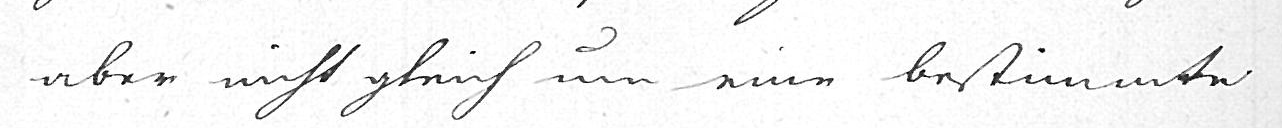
aber nicht gleich um eine bestimmte
